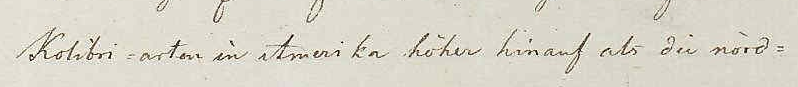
Kolibri-arten in Amerika höher hinauf als die nörd-
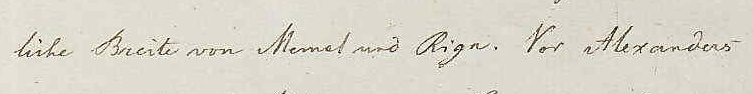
liche Breite von Memel und Riga. Vor Alexanders
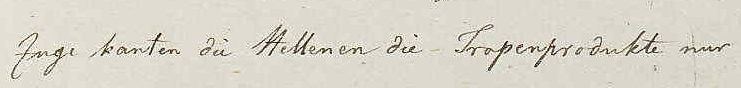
Zuge kanten die Hellenen die Tropenprodukte nur
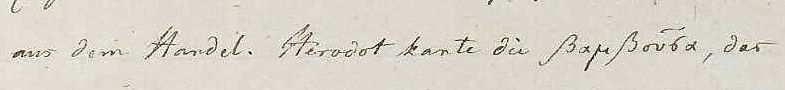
aus dem Handel. Herodot kante die βαμβοῦδα, das
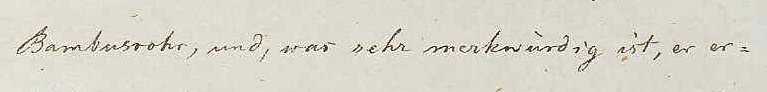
Bambusrohr, und, was sehr merkwürdig ist, er er-
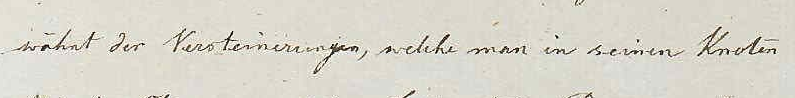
wähnt der Versteinerungen, welche man in seinen Knoten
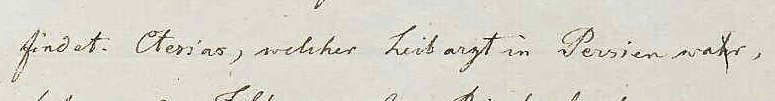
findet. Ctesias, welcher Leibarzt in Persien wahr,
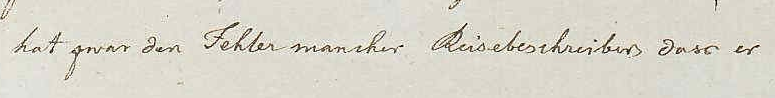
hat zwar den Fehler mancher Reisebeschreiber, dass er
